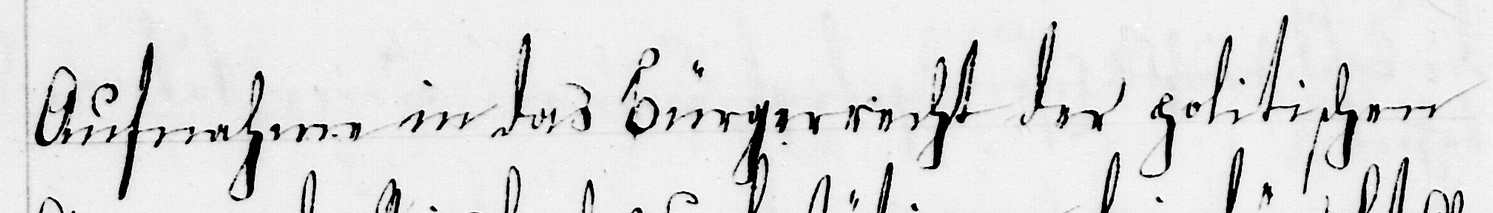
Aufnahme in das Bürgerrecht der politischen
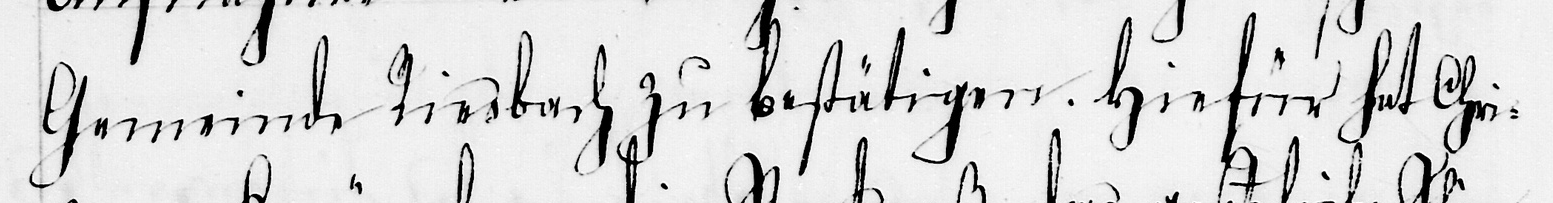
Gemeinde Riesbach zu bestätigen. Hiefür hat Chri¬
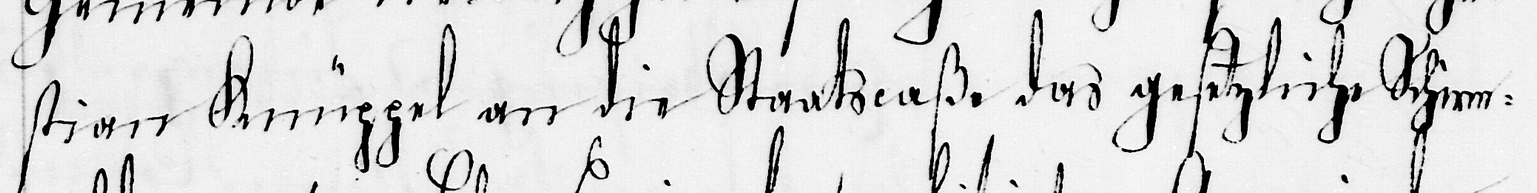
stian Knüppel an die Staatscaße das gesetzliche Schirm¬
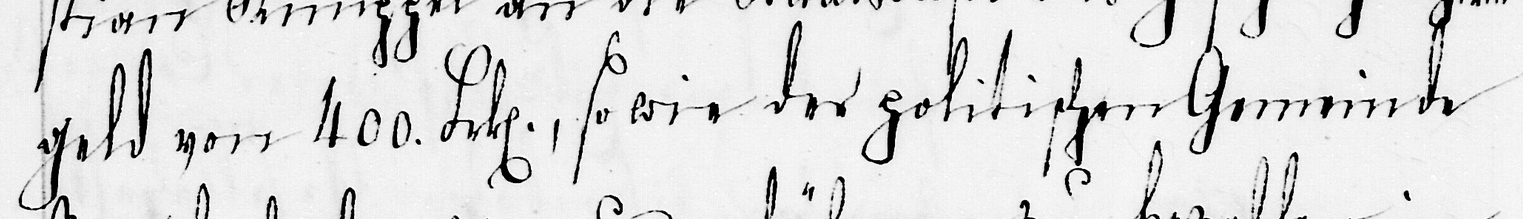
geld von 400. Frk[en]., sowie der politischen Gemeinde
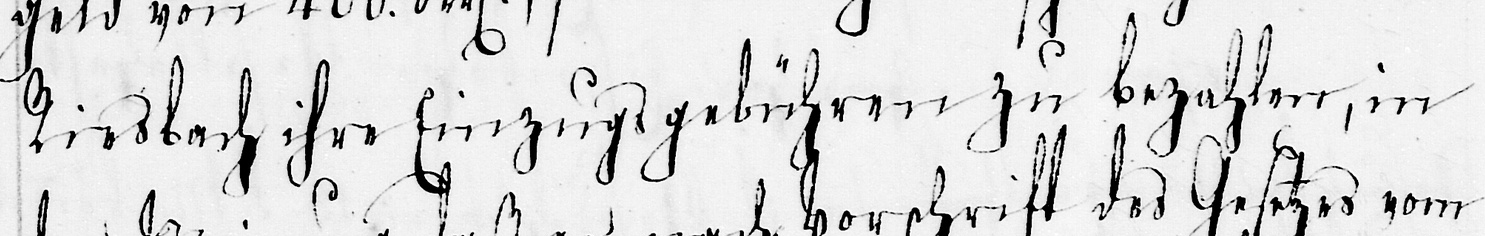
Riesbach ihre Einzugsgebühren zu bezahlen, in
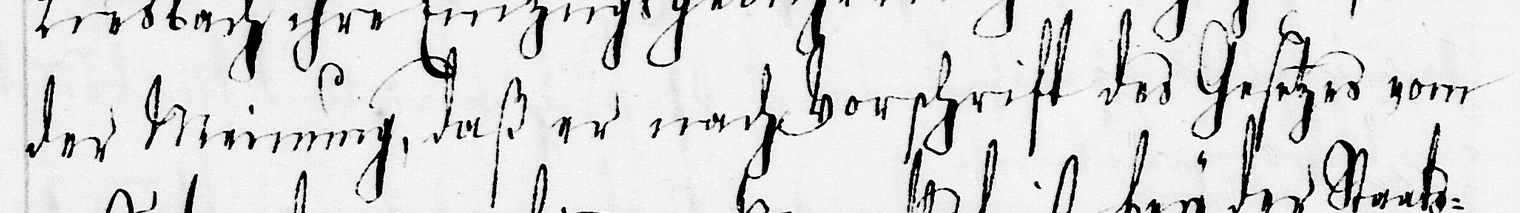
der Meinung, daß er nach Vorschrift des Gesetzes vom
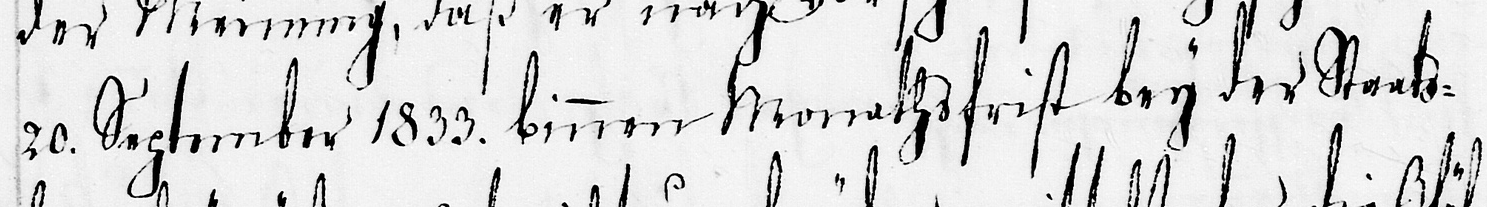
20. September 1833. binnen Monathsfrist bey der Staats¬
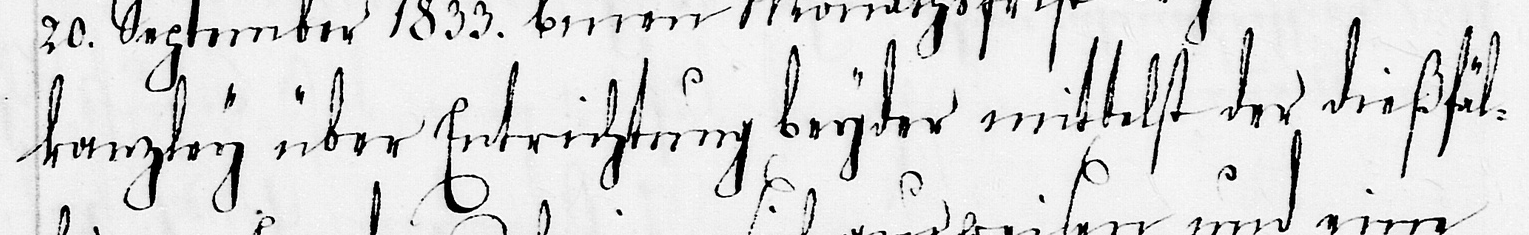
kanzley über Entrichtung beyder mittelst der dießfäl¬
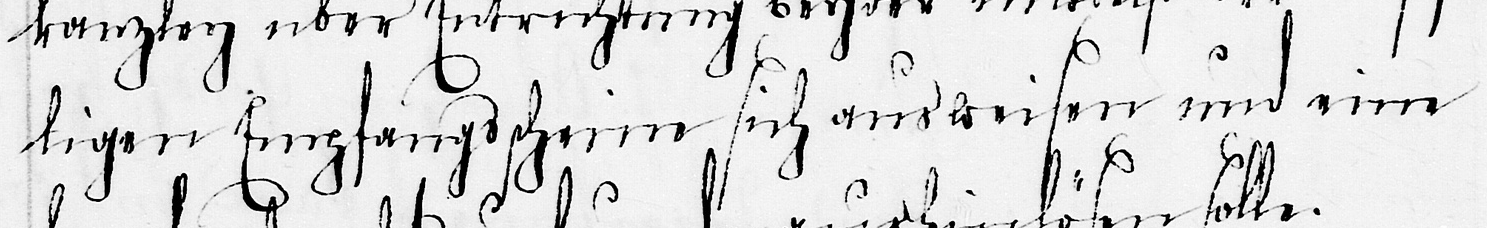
ligen Empfangsscheine sich ausweisen und eine
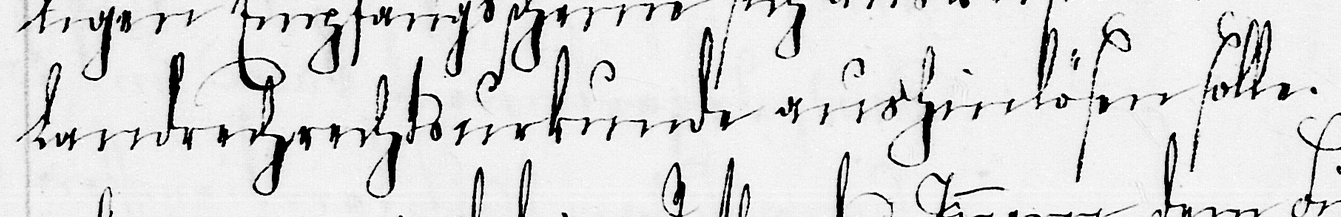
Landrechrechtsurkunde [sic!] aushinlösen
